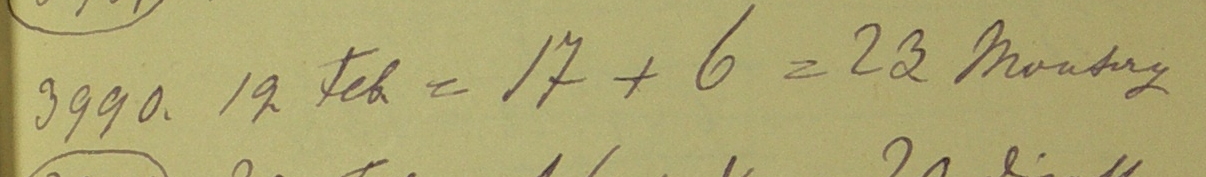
3990. 19. Febr. = 17 + 6 = 23 Montag
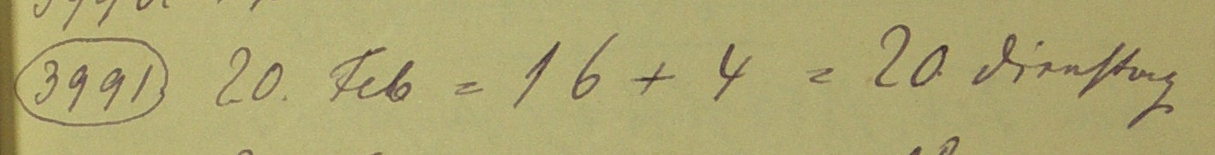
3991. 20. Febr. = 16 + 4 = 20 Dienstag
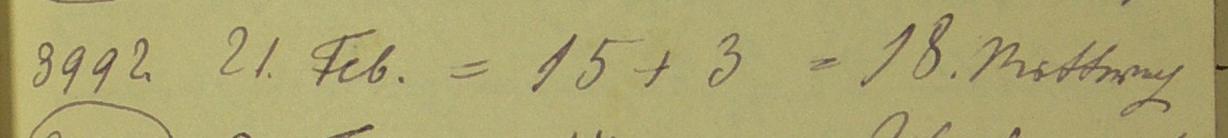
3992. 21. Febr. = 15 + 3 = 18 Mittwoch
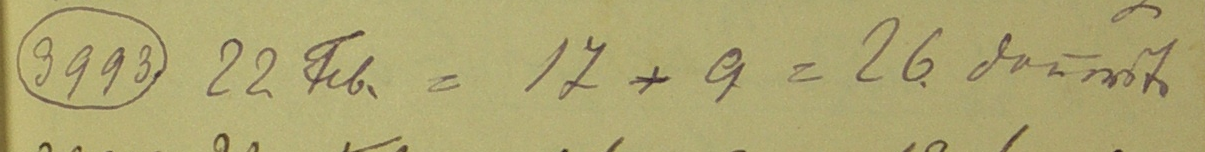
3993. 22. Febr. = 17 + 9 = 26 Donnerstag
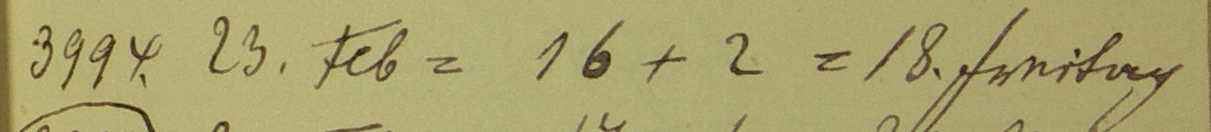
3994. 23. Febr. = 16 + 2 = 18 Freitag
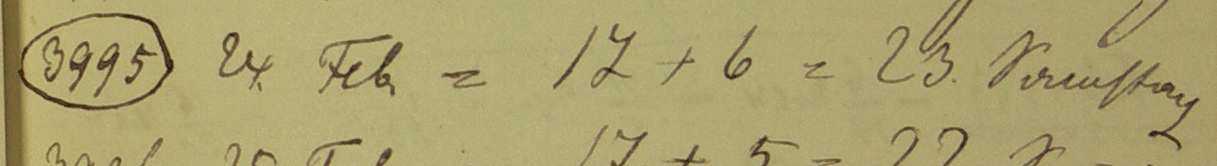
3995. 24. Febr. = 17 + 6 = 23 Samstag
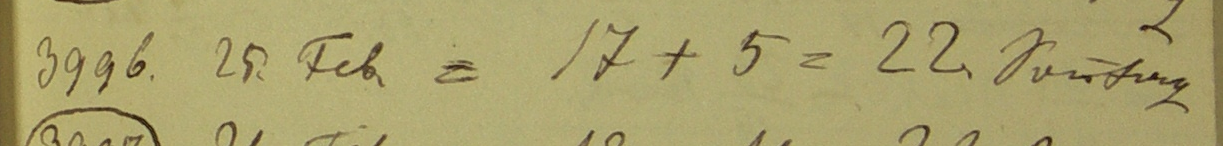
3996. 25. Febr. = 17 + 5 = 22 Sonntag
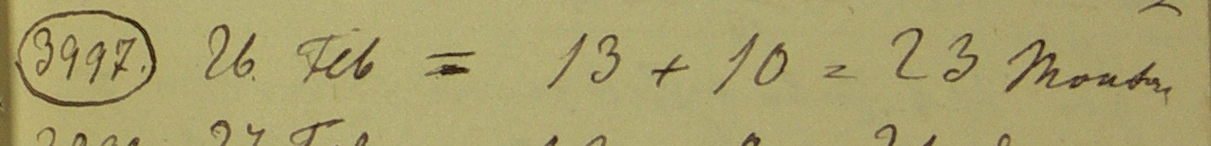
3997. 26. Febr. = 13 + 10 = 23 Montag
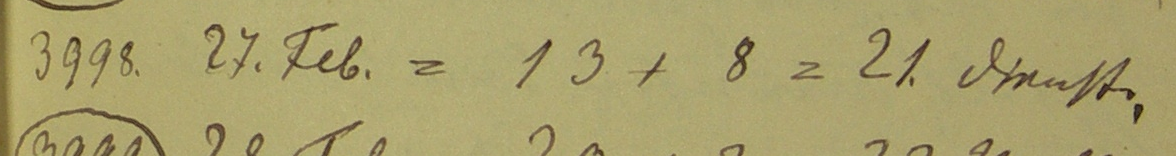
3998. 27. Febr. = 13 + 8 = 21 Dienstag
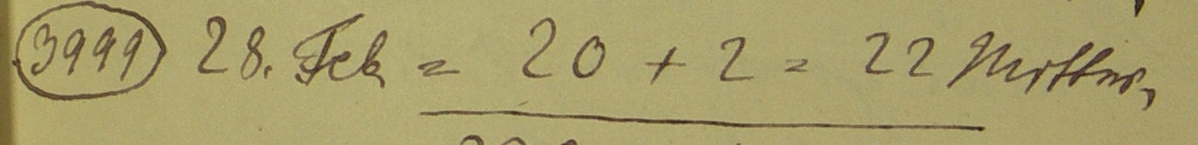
3999. 28. Febr. = 20 + 2 = 22 Mittwoch
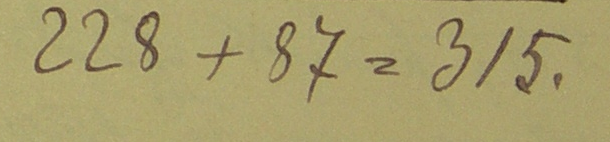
228 + 87 = 315
